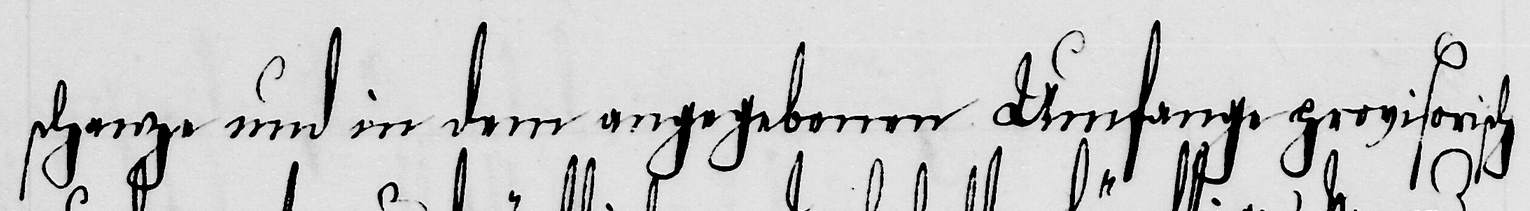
schanze und in dem angegebenen Umfange provisori¬
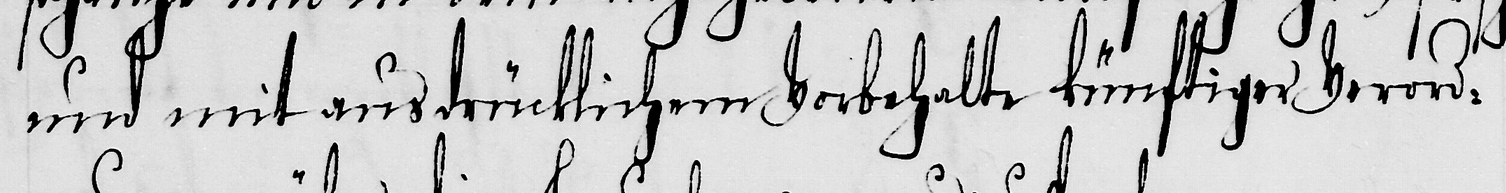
und mit ausdrücklichem Vorbehalte künftiger Verord¬
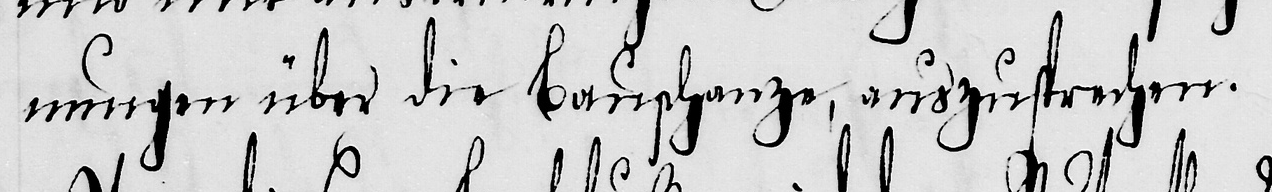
nungen über die Bauschanze, auszusprechen.
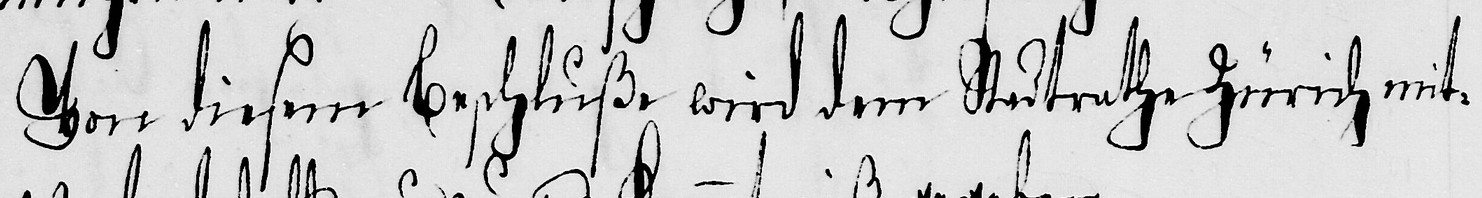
Von diesem Beschluße wird dem Stadtrathe Zürich mit¬
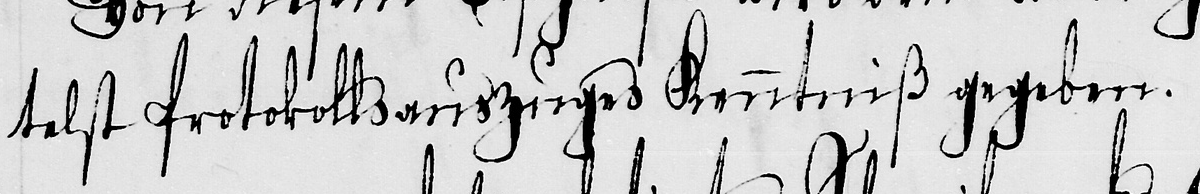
telst Protokollsauszuges Kenntniß gegeben.
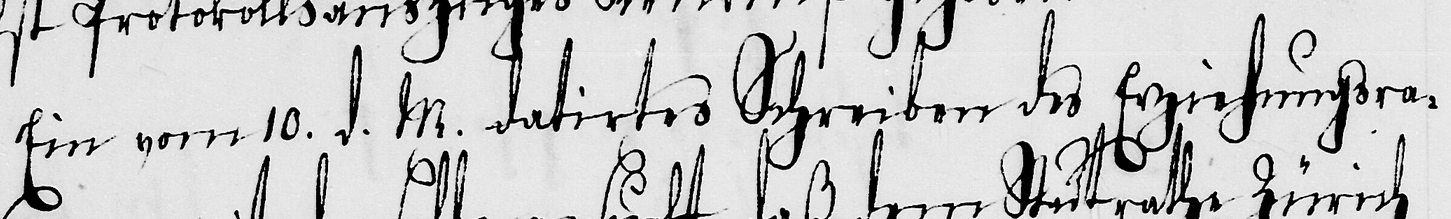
Ein vom 10. d. M. datirtes Schreiben des Erziehungsra¬
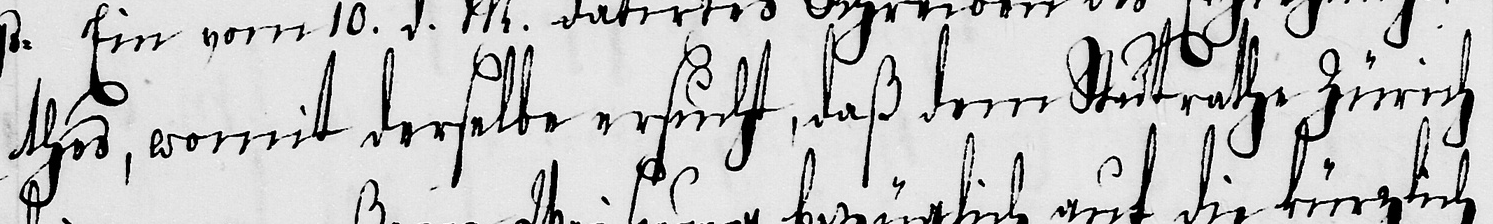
thes, womit derselbe ersucht, daß dem Stadtrathe Zürich
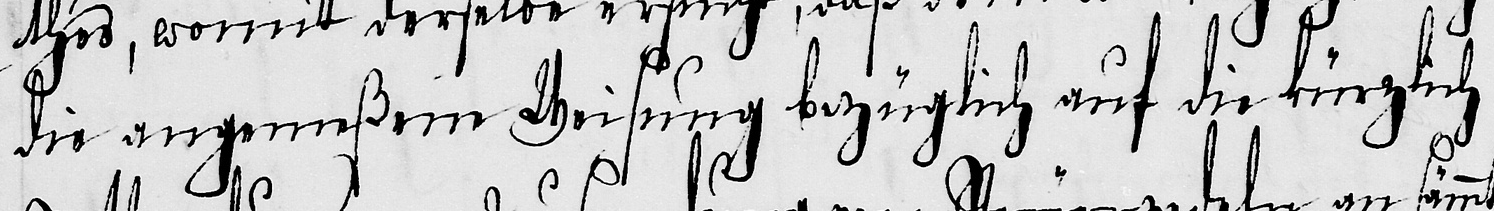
die angemeßene Weisung bezüglich auf die kürzlich
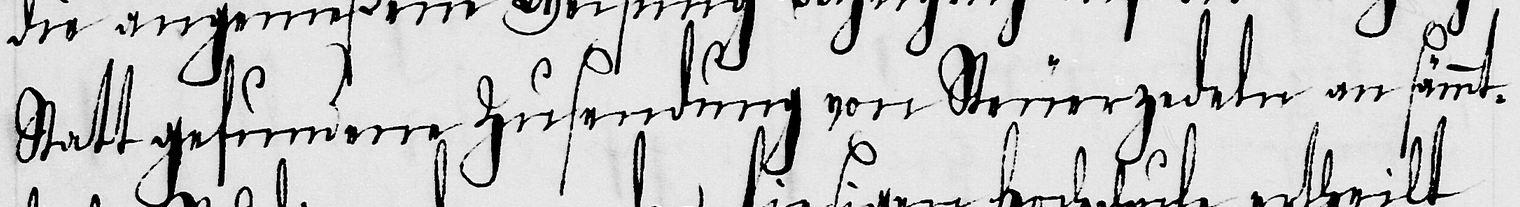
Statt gefundene Zusendung von Steuerzedeln an sämmt¬
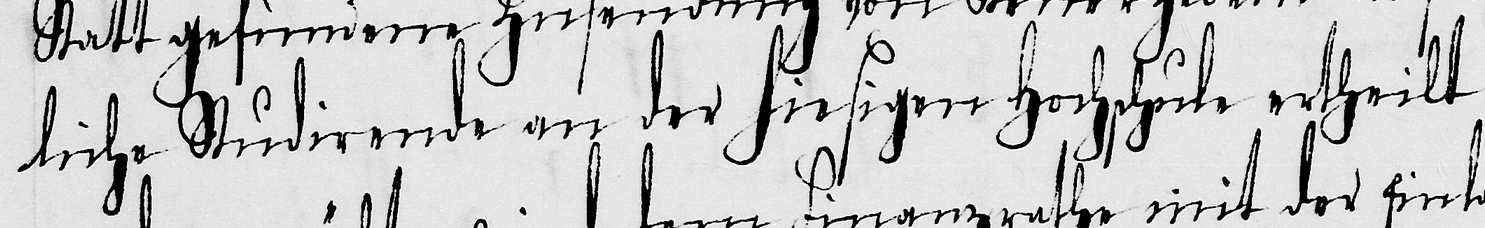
liche Studirende an der hiesigen Hochschule ertheilt
